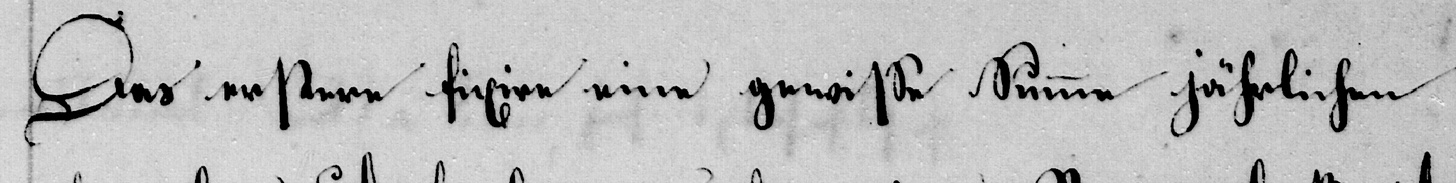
Das erstere fixire eine gewiße Summe jährlichen
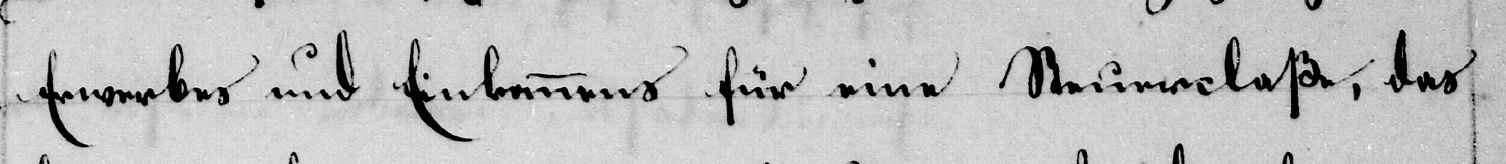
Erwerbes und Einkommens für eine Steuerclaße, das
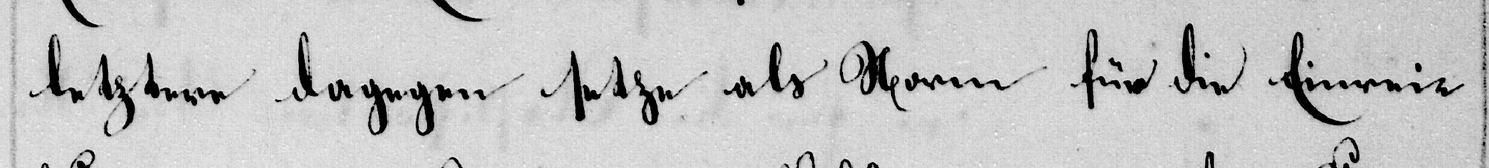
letztere dagegen setze als Norm für die Einreic¬
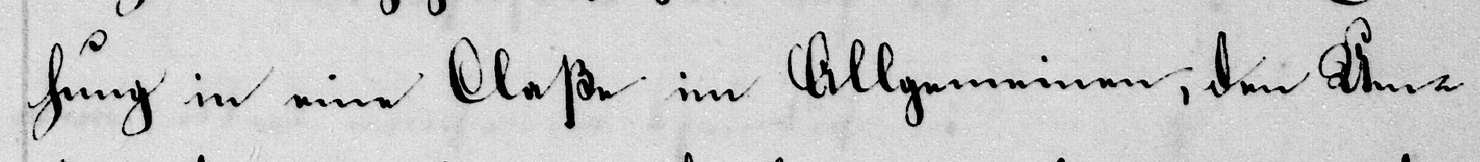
hung in eine Claße im Allgemeinen, den Um¬
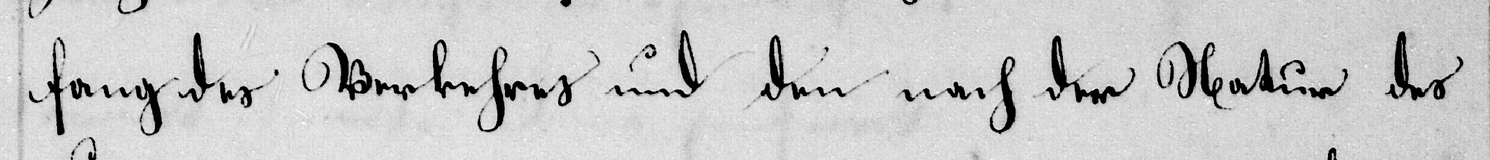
fang des Verkehres und den nach der Natur des
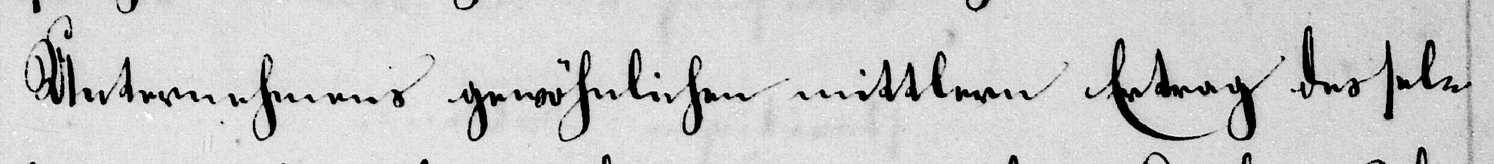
Unternehmens gewöhnlichen mittleren Ertrag dessel¬
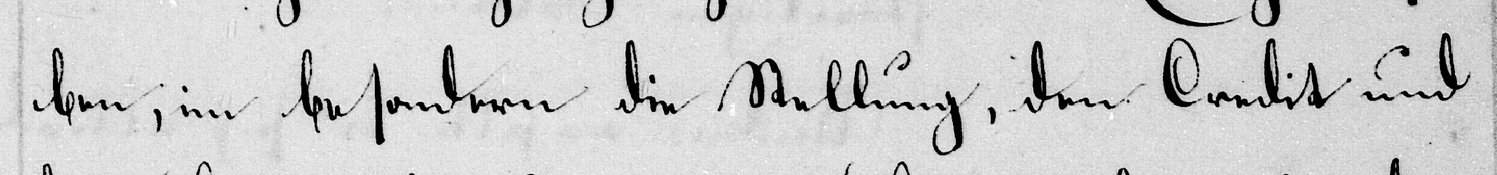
ben, im besondern die Stellung, den Credit und
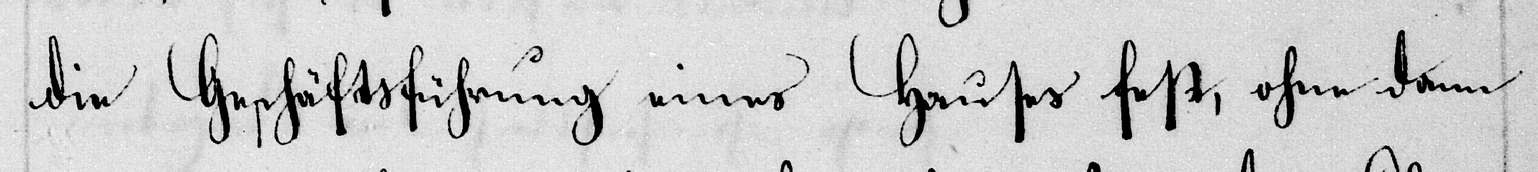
die Geschäftsführung eines Hauses fest, ohne dann
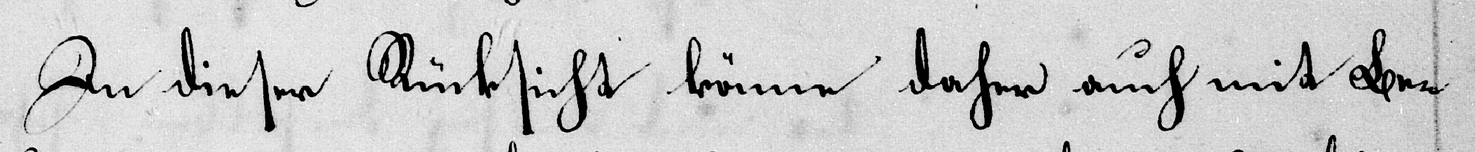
In dieser Rücksicht könne daher auch mit Be¬
